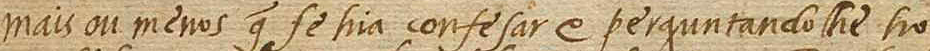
mais ou menos q̄ se hia confesar e perguntando lhe ho
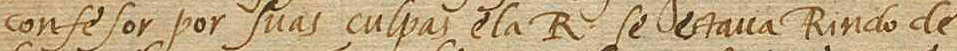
confesor por suas culpas ela R. se estaua Rindo de
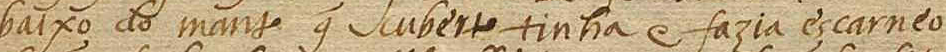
baixo do manto q̄ cuberto tinha e fazia escarneo
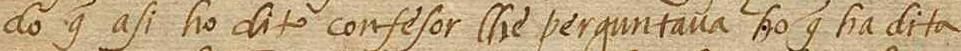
do q̄ asi ho dito confesor lhe perguntaua ho q̄ ha dita
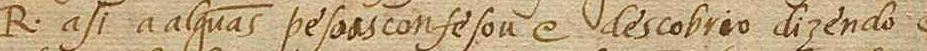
R. asi a algūas pesoas confesou e descobrio dizendo e
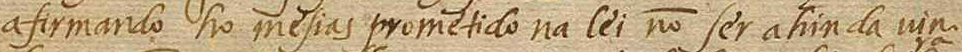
afirmando ho mesias prometido na lei n̄o ser ahinda uin
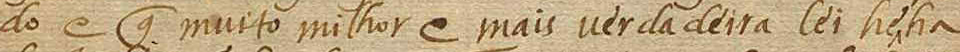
do e q̄ muito milhor e mais uerdadeira lei he ha
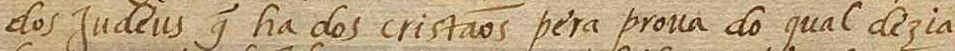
dos Judeus q̄ ha dos cristãos pera proua do qual dezia
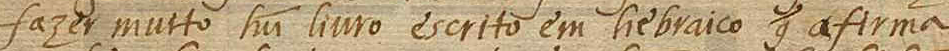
fazer muito hū liuro escrito em hebraico q̄ afirma
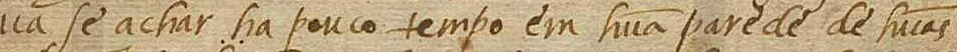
ua se achar ha pouco tempo em hūa parede de hūas
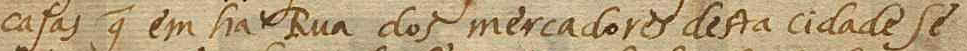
casas q̄ em ha Rua dos mercadores desta cidade se
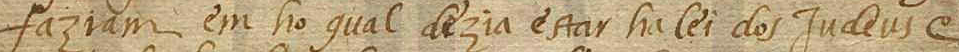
faziam em ho qual dezia estar ha lei dos Judeus e
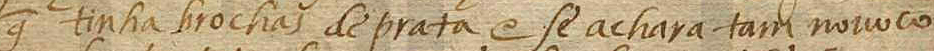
q̄ tinha brochas de prata e se achara tam nouo co
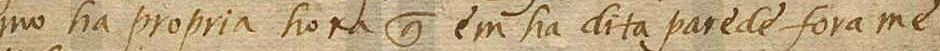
mo ha propria hora q̄ em ha dita parede fora me
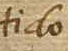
tido
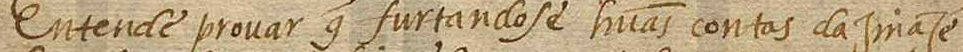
Entende prouar q̄ furtandose hūas contas da JmaJē
